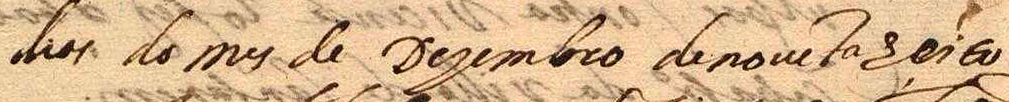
dias do mes de Dezembro de nouēta E oito
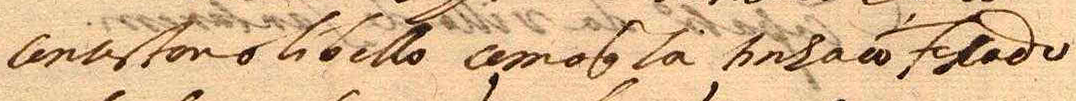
contestou o libello com o q̄ Ia tinha cōfessado
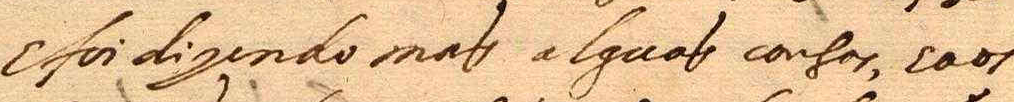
E foi dizendo mais alguas cousas, E aos
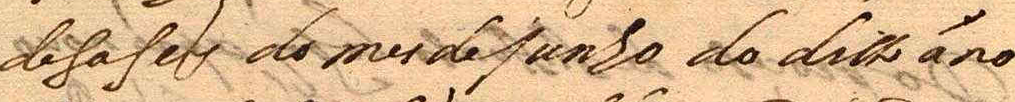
desaseis do mes de junho do ditto an̄o
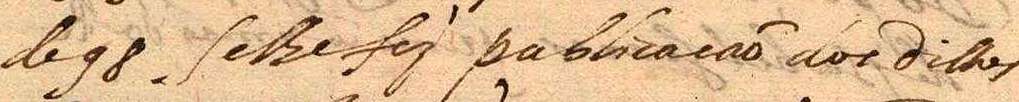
de 98 se lhe fez publicaçaõ dos dittos
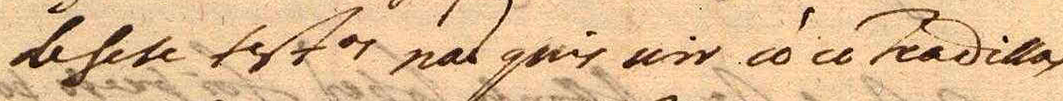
de sete testas naõ quis uir cō cōtradittas
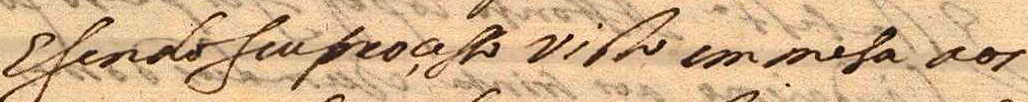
E sendo seu proçesso visto em mesa aos
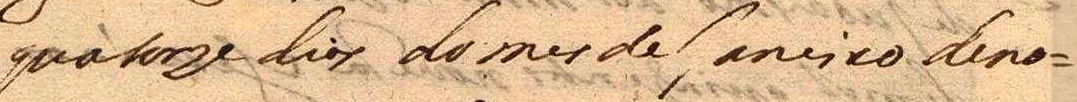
quatorze dias do mes de Janeiro de no
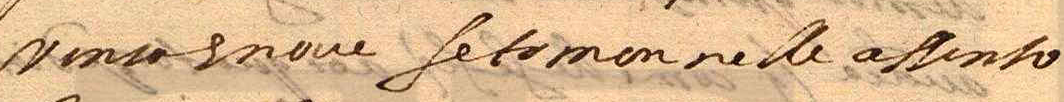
venta E noue se tomou nelle assento
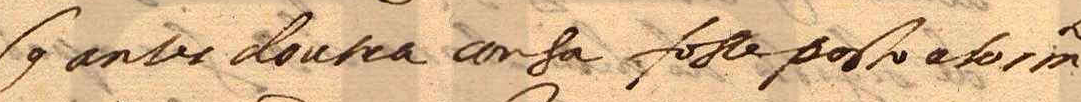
q̄ antes doutra cousa fosse posto a torm.to
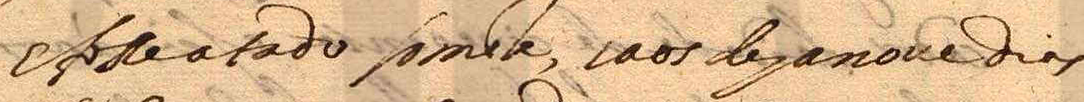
E fosse atado somēte, e aos dezanoue dias
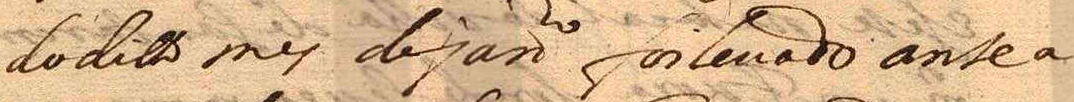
do ditto mes de janro foi leuado ante a
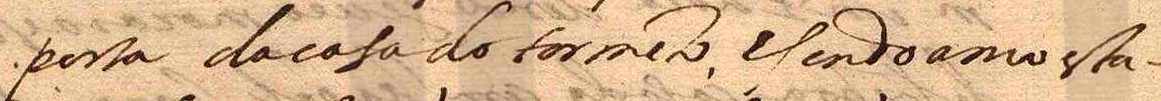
porta da casa do tormēto, E sendo amoesta
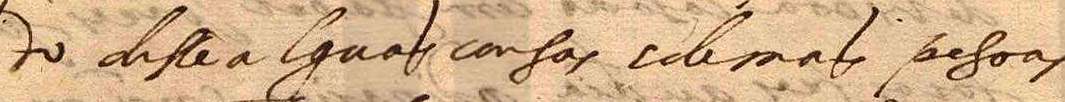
do disse alguas cousas e de mais pesoas
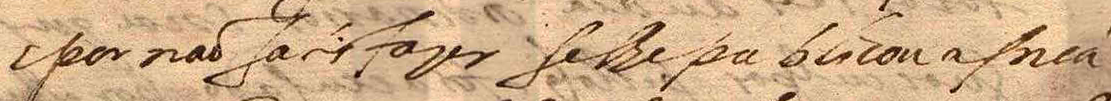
E por naõ satisfazer se lhe publicou a sncā
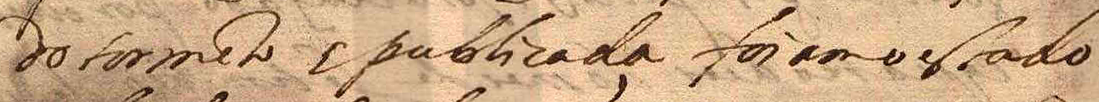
do tormēto E publicada foi amoestado
